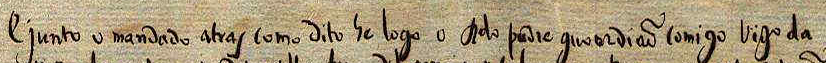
E junto o mandado atras como dito he logo o Rdo padre guoardiaõ comigo vigo da
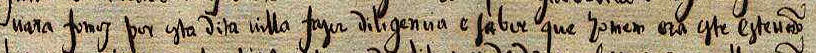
uara fomos por esta dita uilla fazer deligencia e saber que homem era este esteuaõ
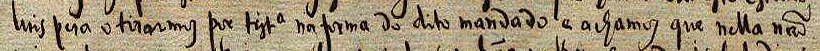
luis pera o tirarmos por testa na forma do dito mandado e achamos que nella naõ
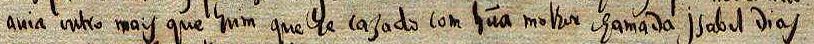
auia outro mais que hum que he cazado com hūa molher chamada Jsabel dias
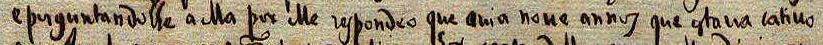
e perguntandolhe a ella por elle respondeo que auia noue annos que estaua catiuo
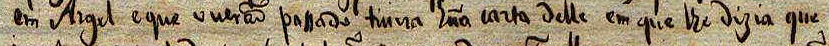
em Argel e que o verão passado tiuera hūa carta delle em que lhe dizia que
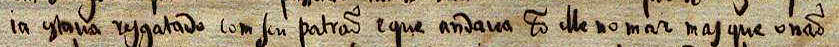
ia estaua resgatado com seu patraõ e que andaua cō elle no mar mas que o naõ
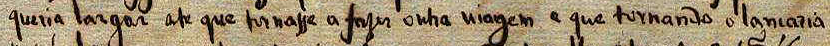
queria largar ate que tornasse a fazer outra uiagem e que tornando o lançaria
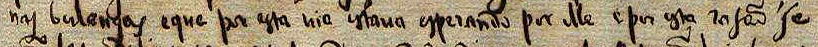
nas bulengas e que por esta uia estaua esperando por elle E por esta rasão se
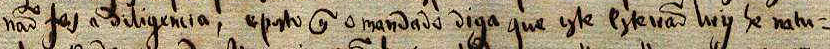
naõ fes a diligencia, e posto q̄ o mandado diga que este esteuaõ luis he natu
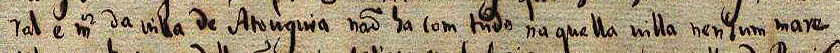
ral e mor da uilla de Atouguia naõ ha comtudo naquella uilla nenhum mare
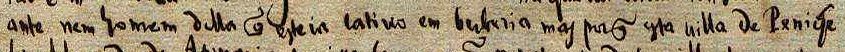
ante nem homem della q̄ esteia catiuo em berberia mas porq̄ esta uilla de Peniche
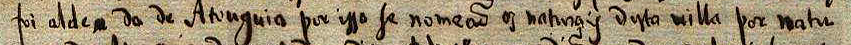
foi aldea da de Atouguia por isso se nomeaõ os naturais desta uilla por natu
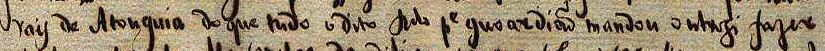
rais de Atouguia do que tudo o dito Rdo pe guoardiaõ mandou outrosi fazer
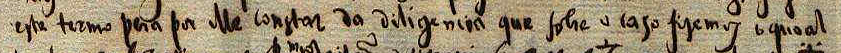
este termo pera por elle constar da diligencia que sobre o caso fizemos o quoal
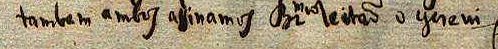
tambem ambos assinamos Brmeo leitaõ o escreui
